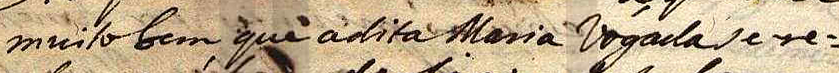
muito bem, que a dita Maria Vogada se re
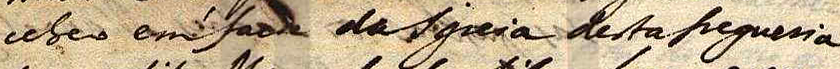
cebeo em face da Igreia desta freguezia
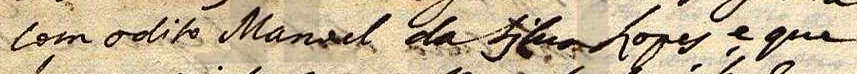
com o dito Manoel da Sjlua Lopes, e que
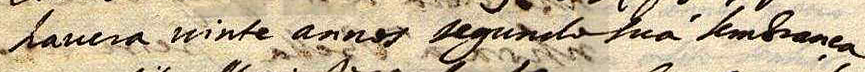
hauera uinte annos segundo sua lembrança,
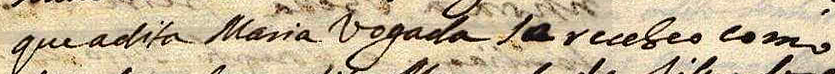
que a dita Maria Vogada se recebeo com o
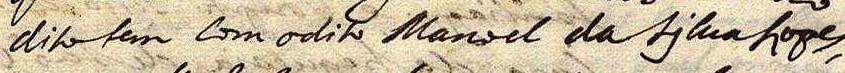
dito tem com o dito Manoel da Sjlua Lopes,
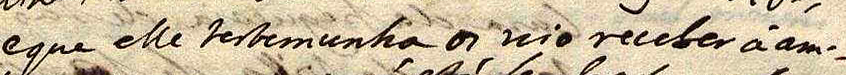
e que elle testemunha os uio receber á am
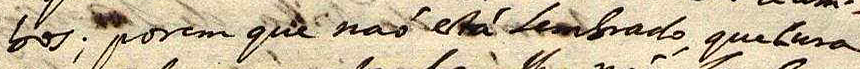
bos; porem que naõ está lembrado, que Cura
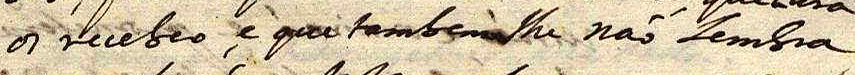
os recebeo, e que tambem lhe naõ lembra
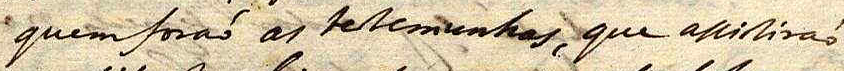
quem foraõ as testemunhas, que assistiraõ
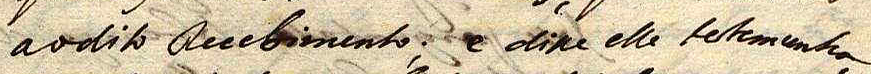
ao dito Recebimento; e disse elle testemunha,
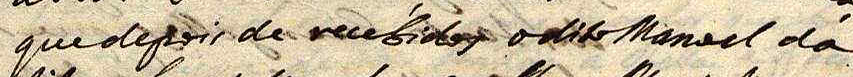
que depois de recebidos o dito Manoel da
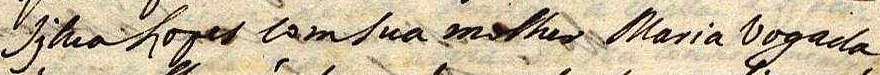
Sjlua Lopes com sua molher Maria Vogada
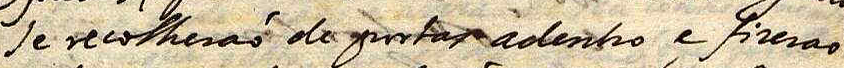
se recolheraõ de portas adentro, e fizeraõ
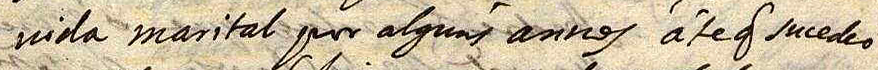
uida marital por alguns annos ate q̄ sucedeo
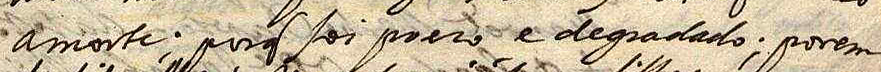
a morte; porq̄ foi prezo, e degradado; porem
